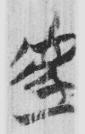𫊟
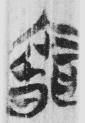{尒䎽}
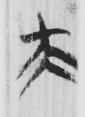夫
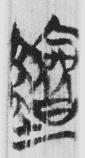險
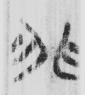非
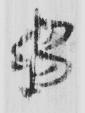矛
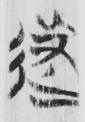﨤
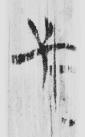干
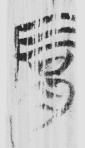{厂肙}
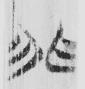非
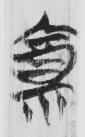{富示}
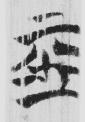亞
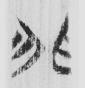非
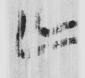亡
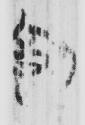飤
